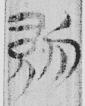則
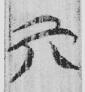亓
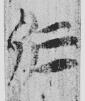於
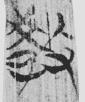教
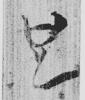也
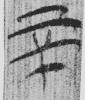不
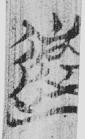遠
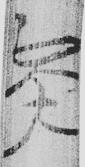矣
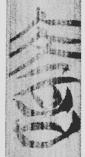{宀文言}
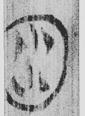囦（淵）
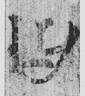曰
